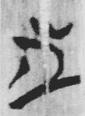之
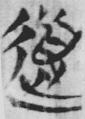道
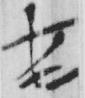才（存）
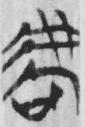乎
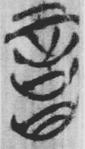○（意）
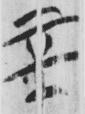不
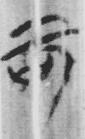可
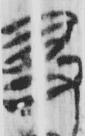𠭁
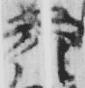而
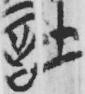○（睹）
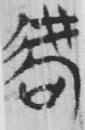唬（乎）
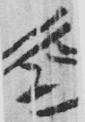帀（師）
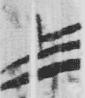上（尚）
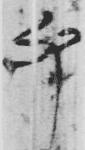父
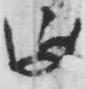曰
